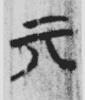亓
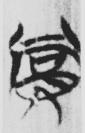賞
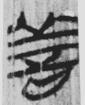善
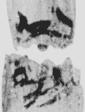罰
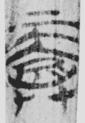暴
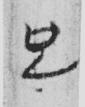也
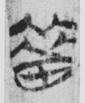昔
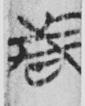者
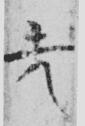圥（堯）
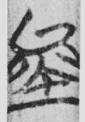{允火土}（舜）
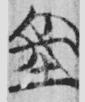{禹土}（禹）
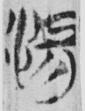湯
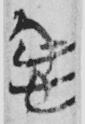{身心}（仁）
